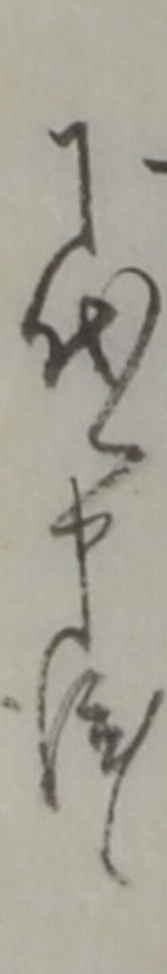丁代へ申渡候

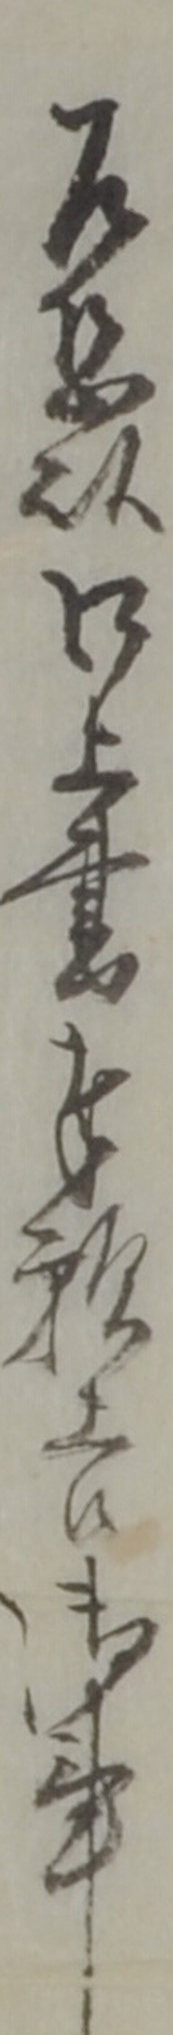乍恐以口上書奉願上候御事
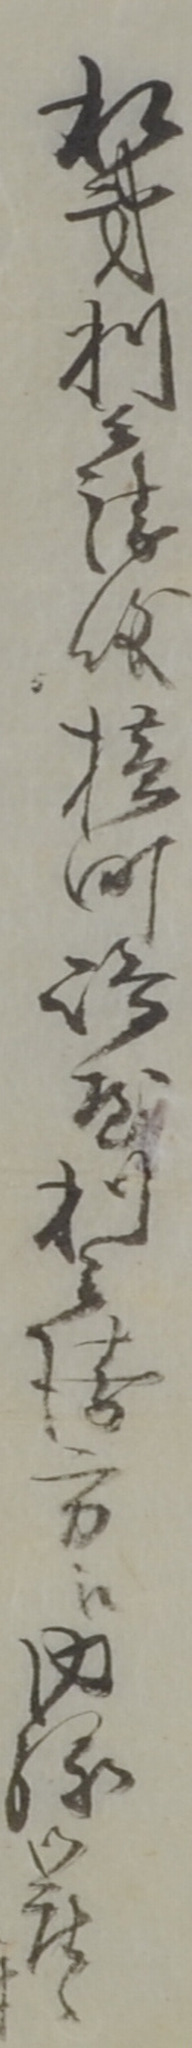私弟利兵衛儀横町嶋屋利兵衛方江内縁御座候
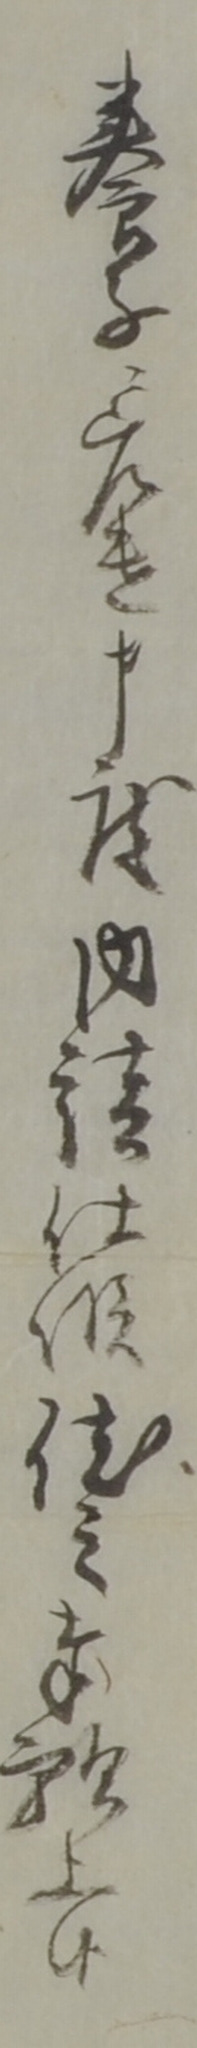養子ニ差遣申度内談仕候依之奉願上候
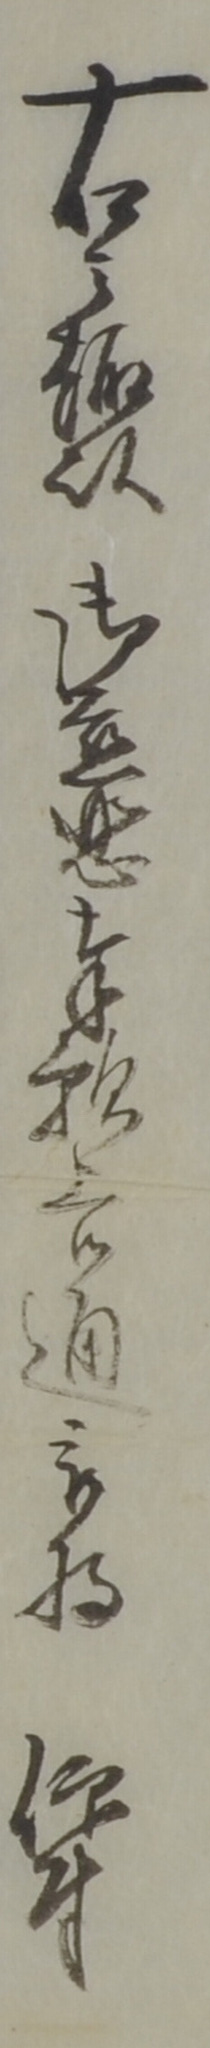右之趣以御慈悲奉願上候通被為仰付
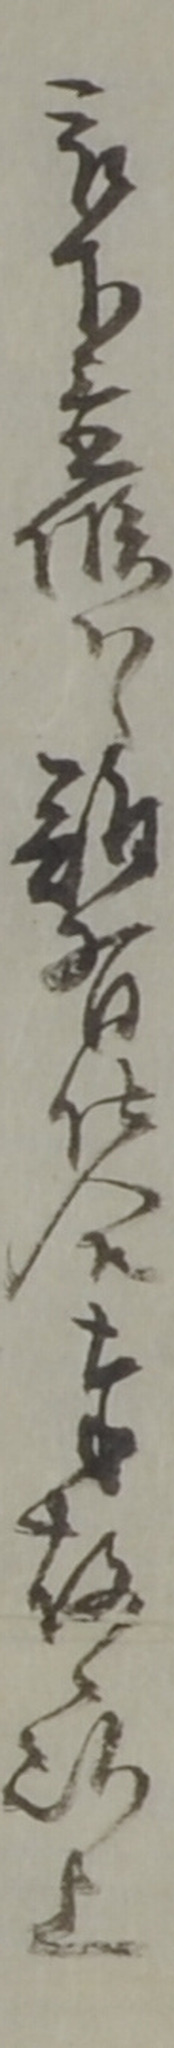被下置候ハヽ難有仕合奉存候以上
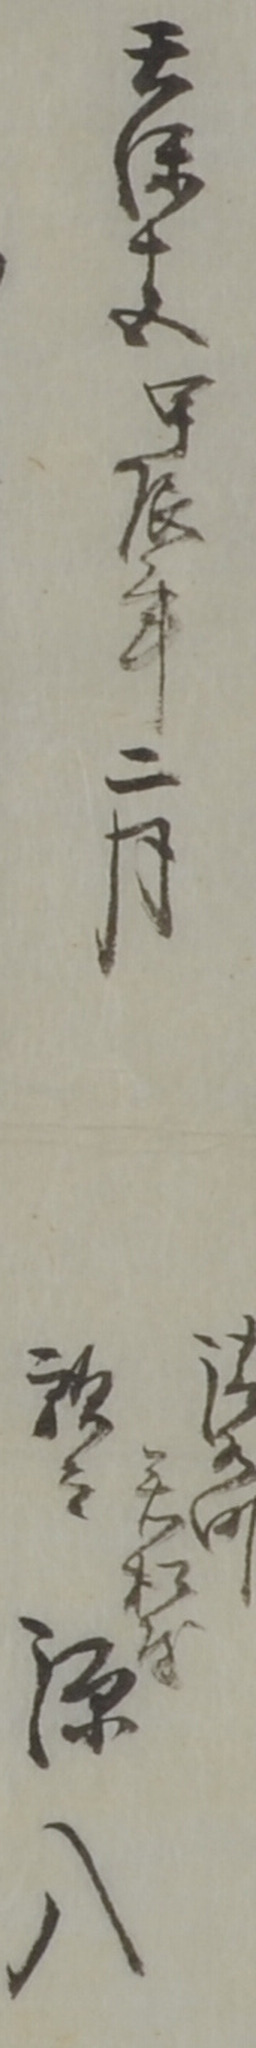天保十五甲辰年二月若松屋
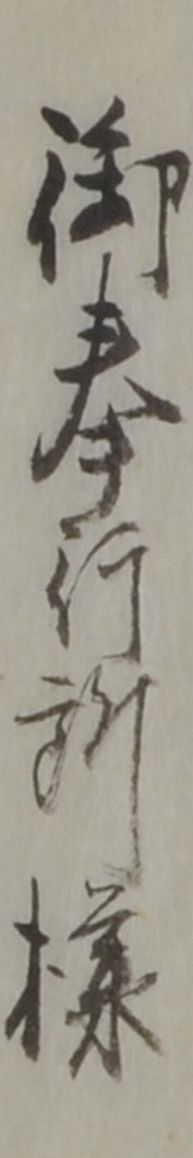御奉行所様
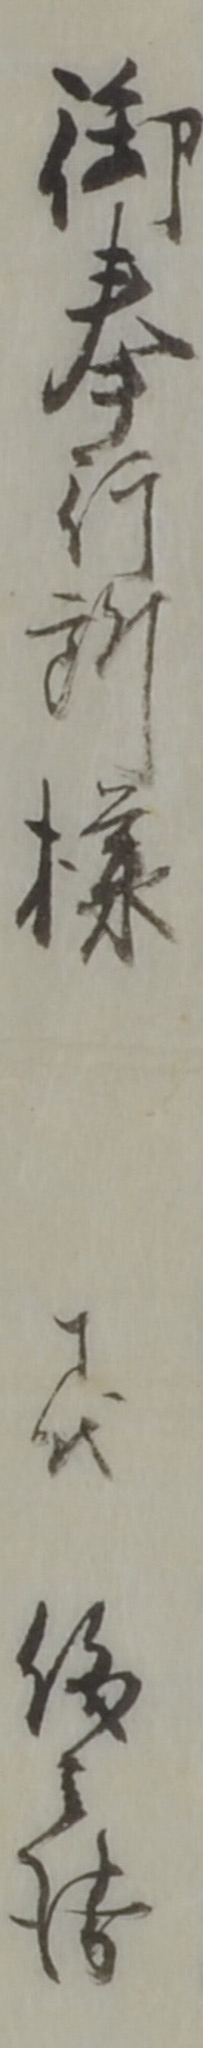御奉行所様丁代儀兵衛
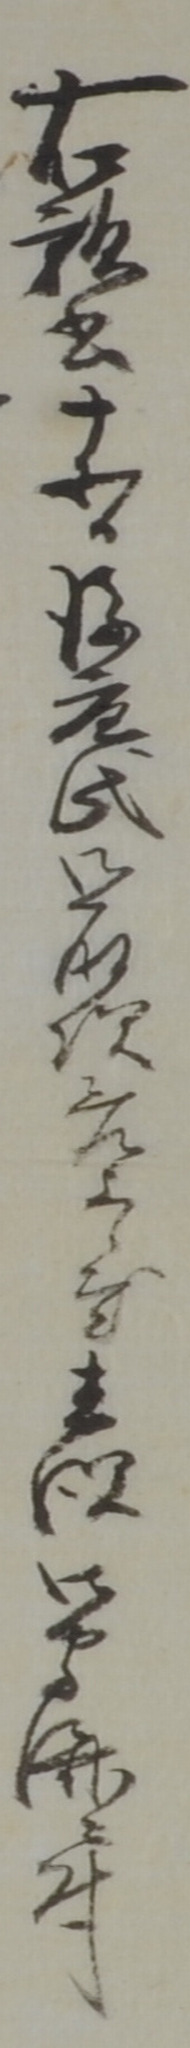右願書十五日後藤氏御取次差上候処直様御聞済ニ付
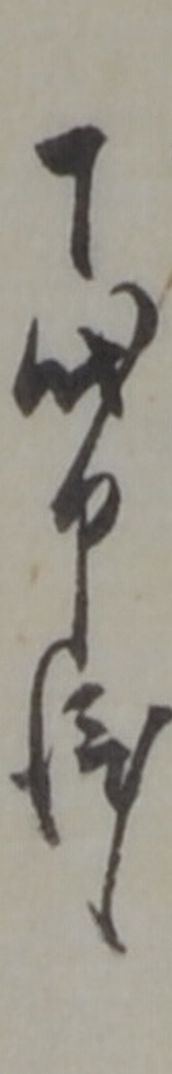丁代申渡候
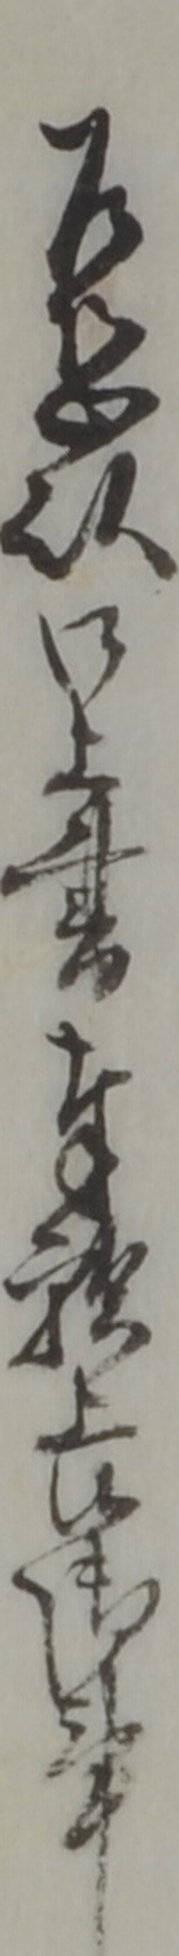乍恐以口上書奉願上候御事
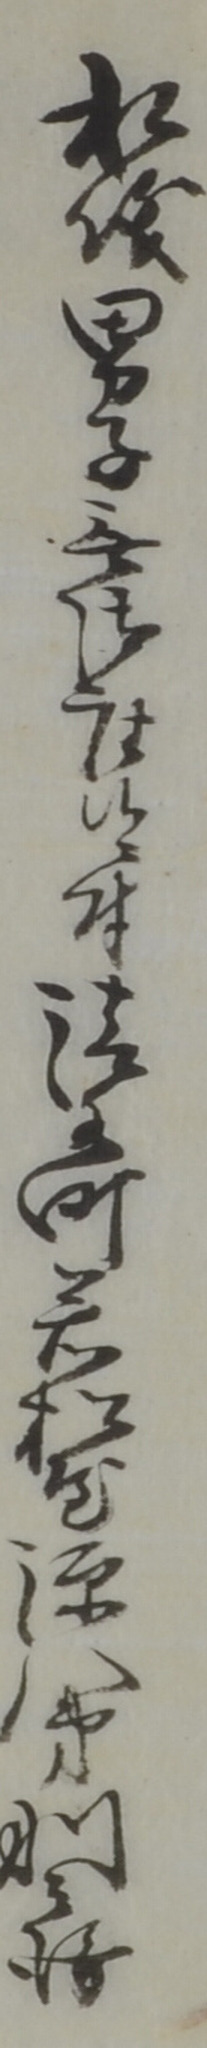私儀男子無御座候ニ付清水町若松屋源八弟利兵衛
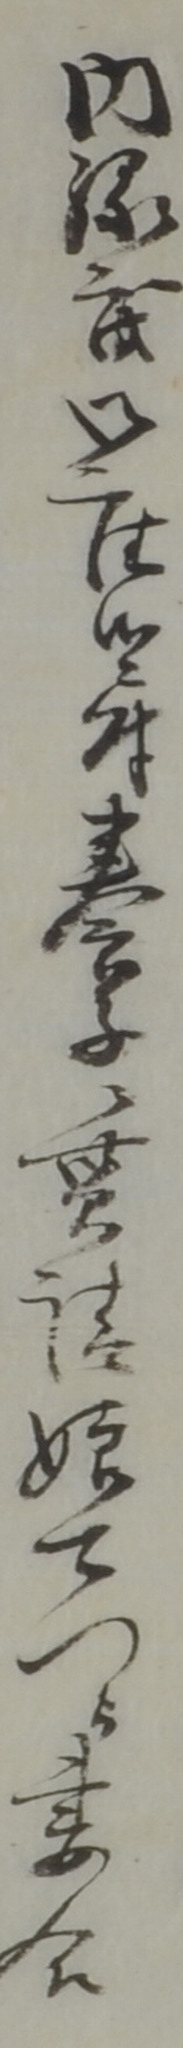内縁も御座候ニ付養子ニ貰請娘てつ与妻合
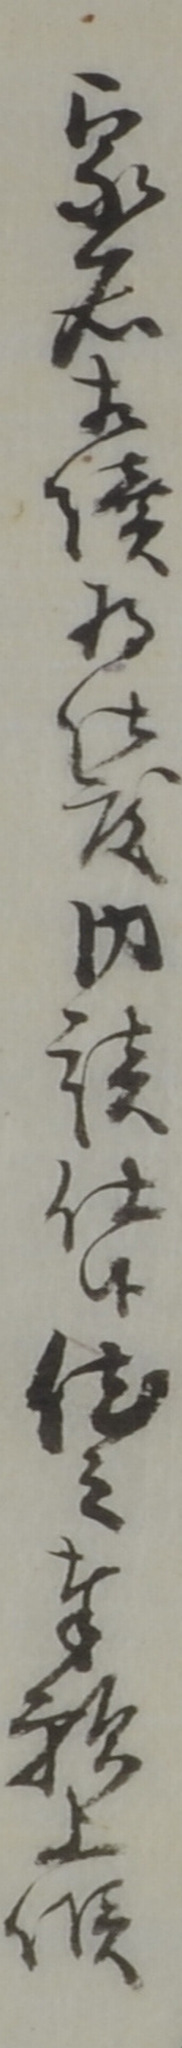家名相続為仕度内談仕候依之奉願上候
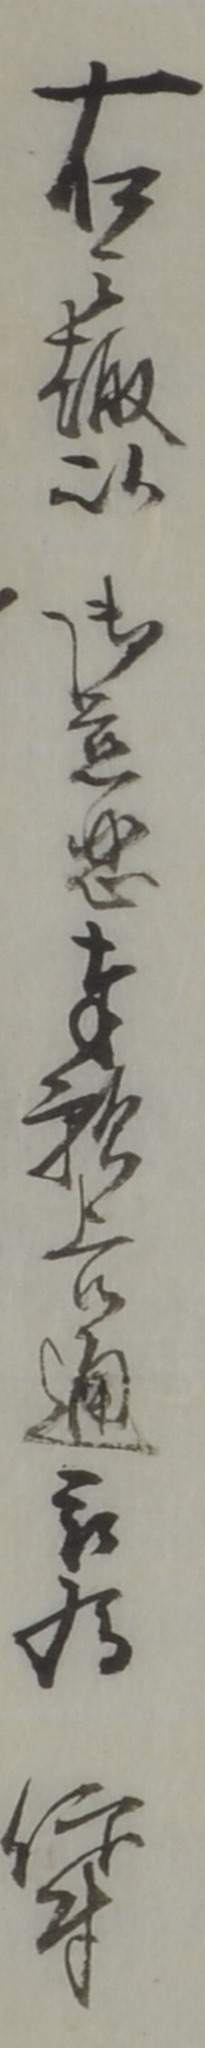右之趣以御慈悲奉願上候通被為仰付
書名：諸願書控簿
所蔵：伊那市立高遠町図書館・合同会社AMANE
